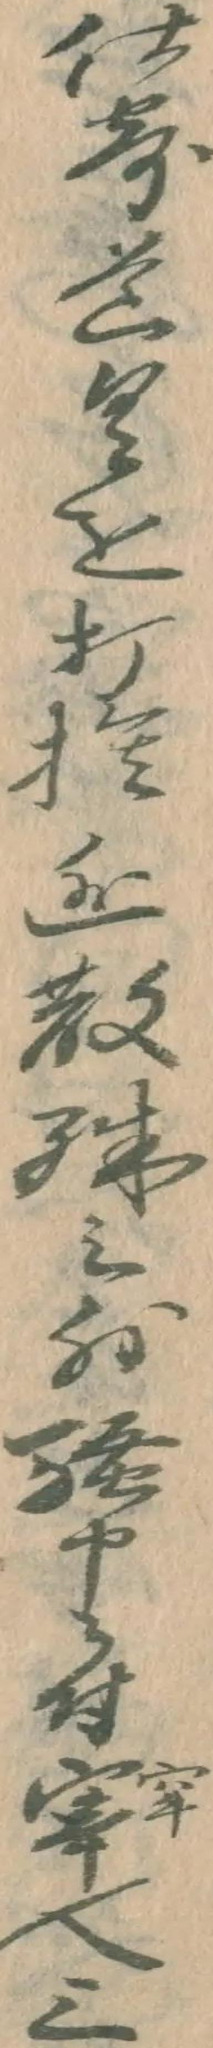仕寄道具を打捨逃散殊之外騒申に付牢人三
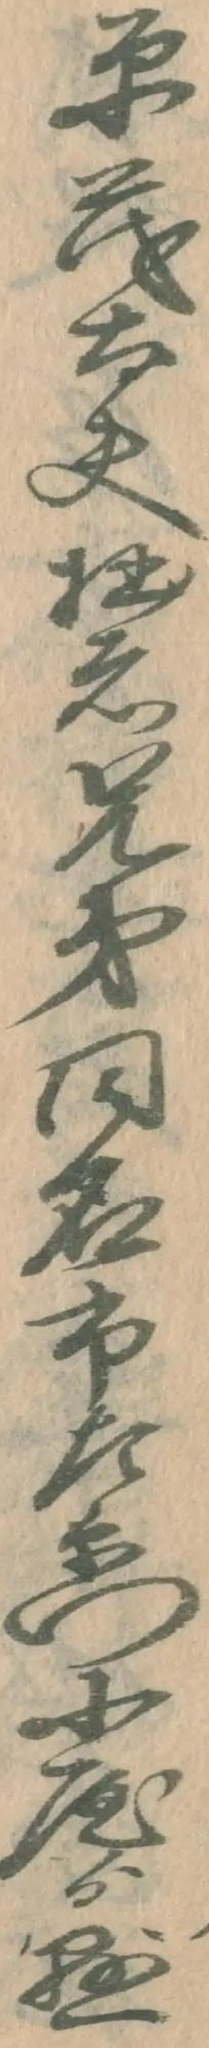原茂太夫拙者兄弟同名市左衛門小屋ゟ懸

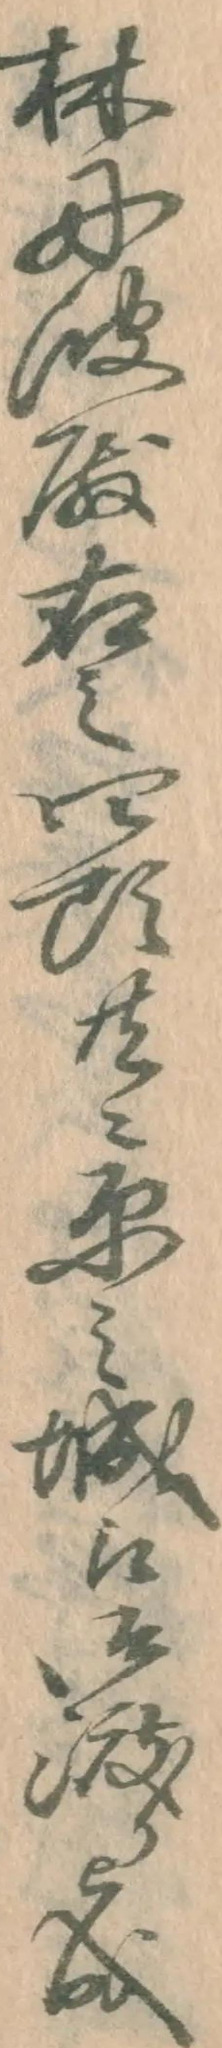林丹波殿右之四頭共に原之城江御渡り被成
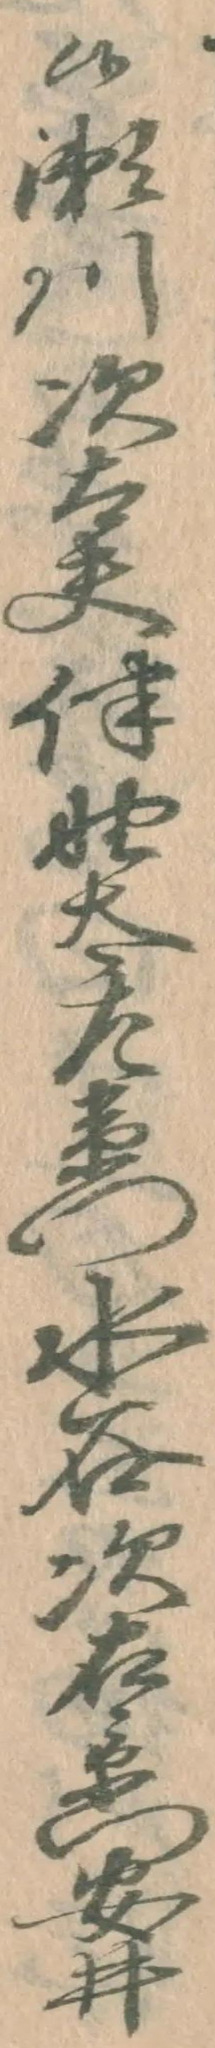候瀬川次太夫伴野太左衛門水谷次右衛門安井
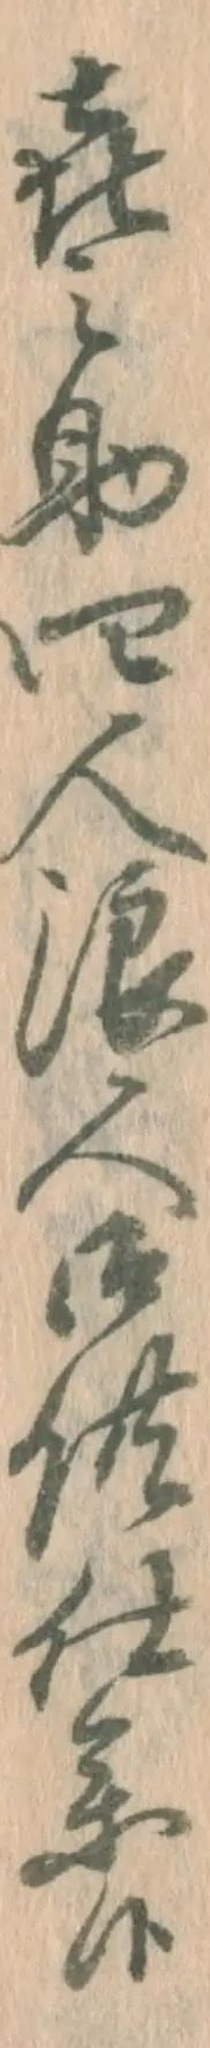喜之助四人浪人御供仕参候
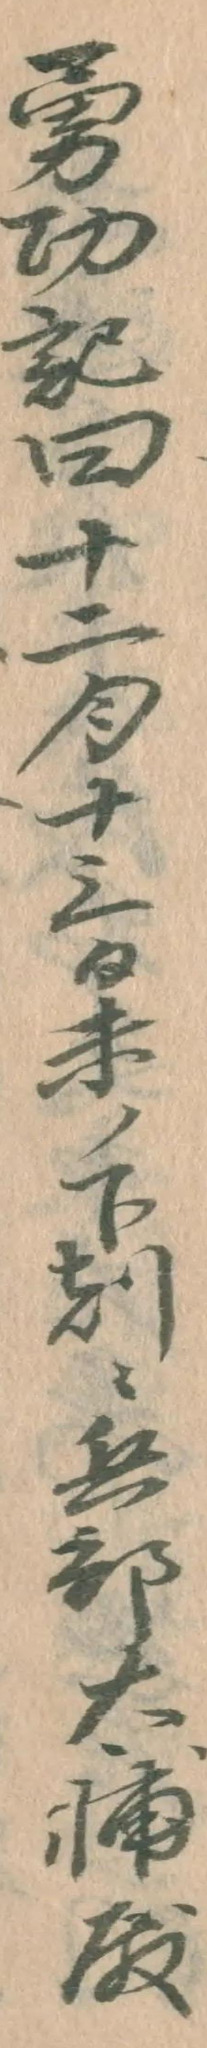勇功記曰十二月十三日未之下刻に兵部太輔殿
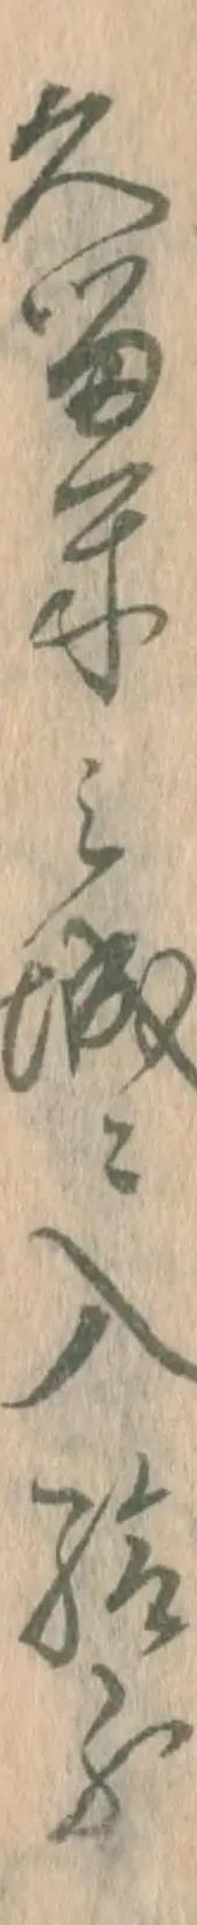久留米之城に入給ふ
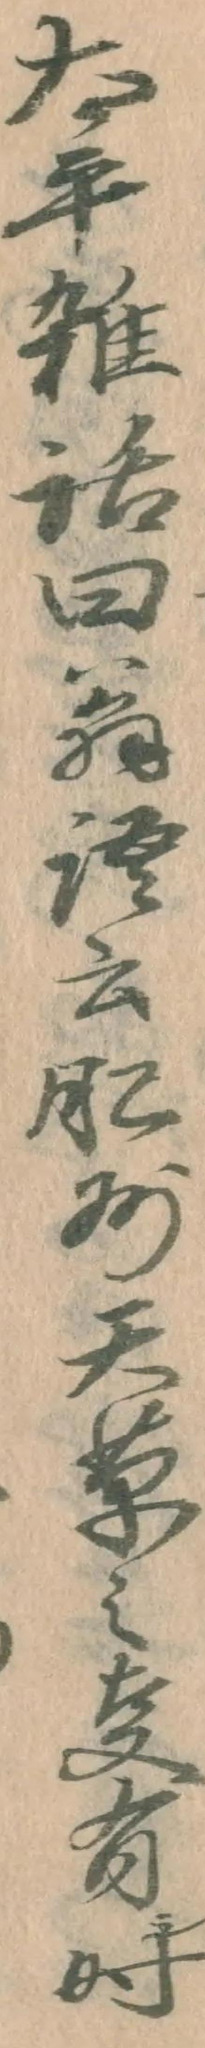太平雑話曰翁語云肥前天草之事有し時
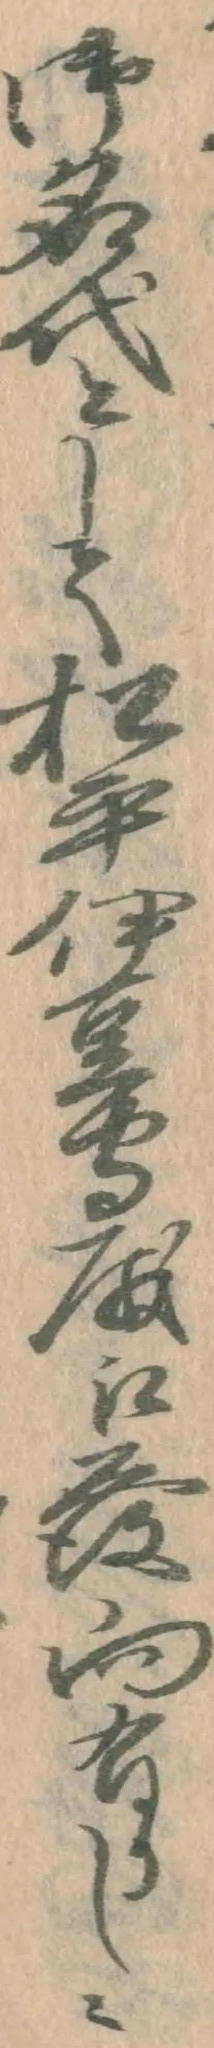御名代として松平伊豆守殿江発向有りしに
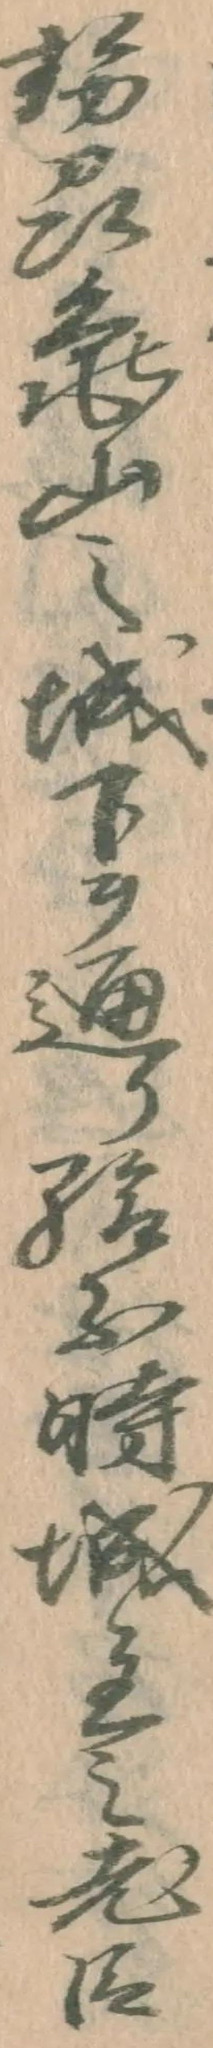勢州亀山之城下を通り給ふ時城主之老臣
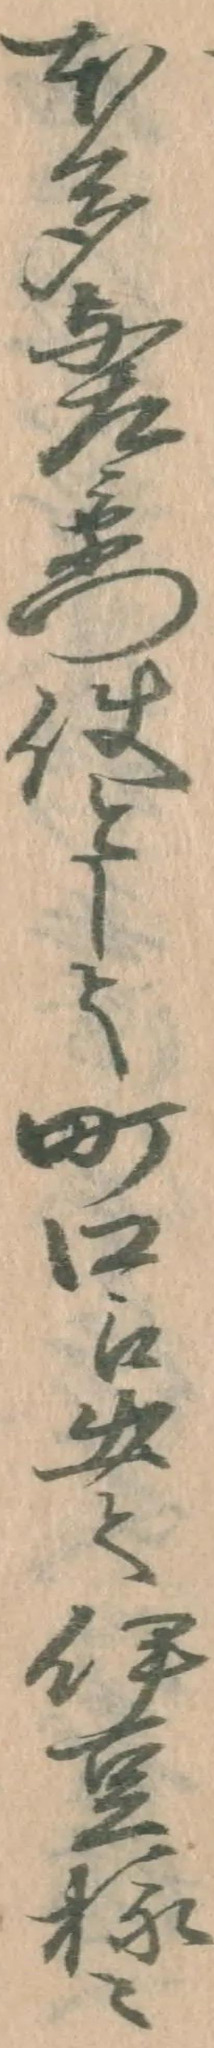本多与左衛門使として町口江出て伊豆様に
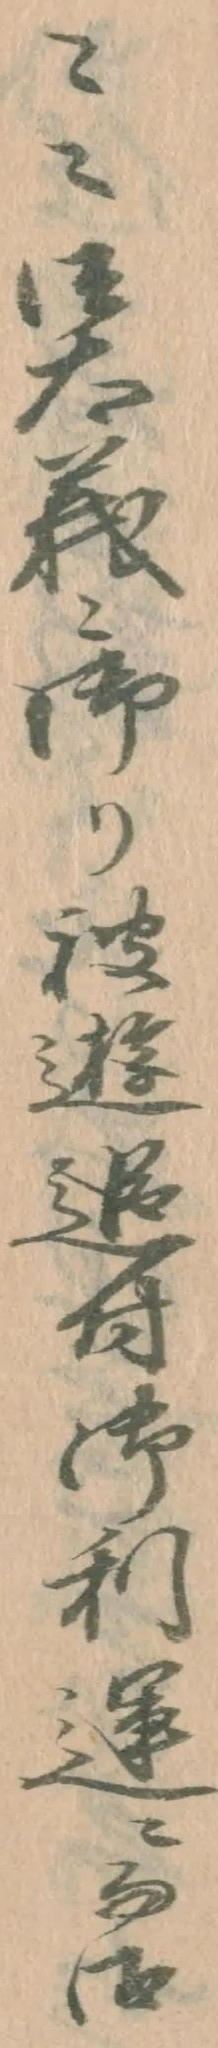々々御太義に御り被遊追付御利運に而御
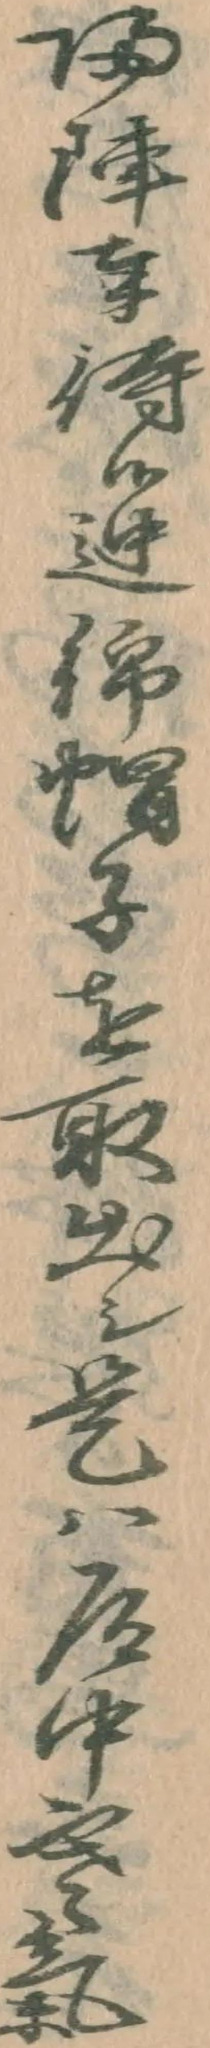帰陣奉待候迚綿帽子を取出し是は道中寒気
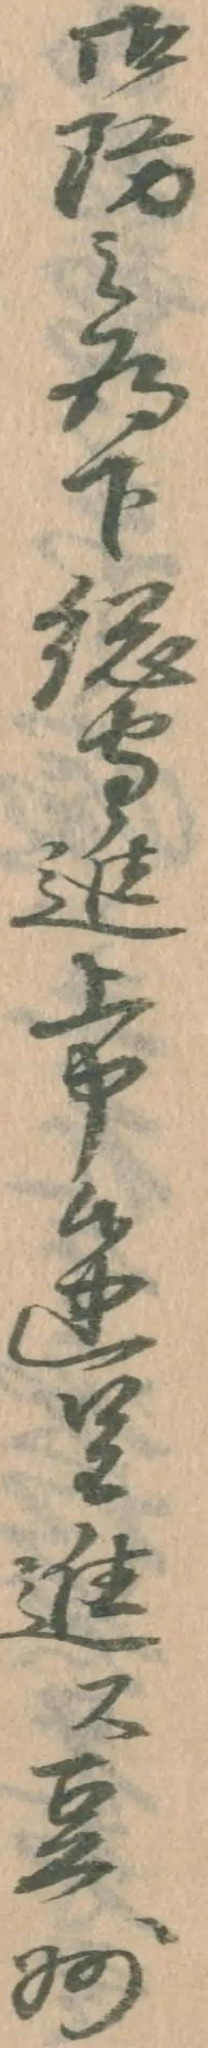御防之為下総守進上申候迚足進す豆州
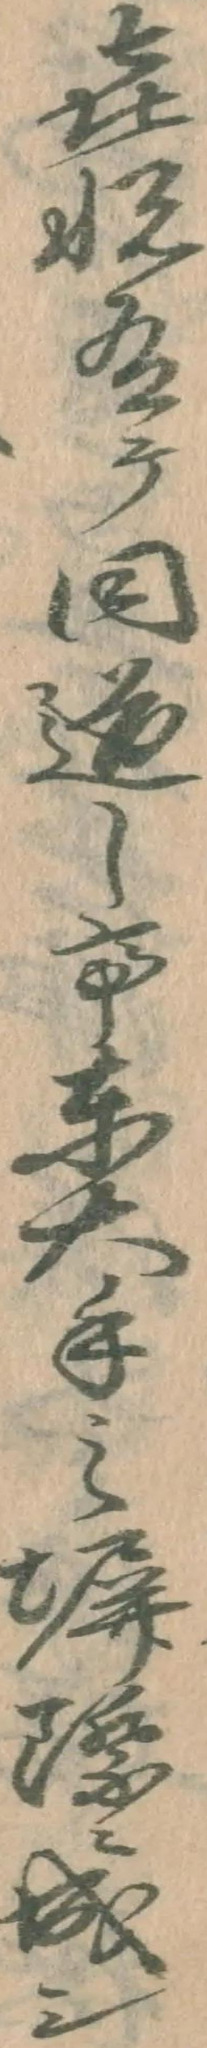喜悦有て同道之亭東大手之塀際に成し
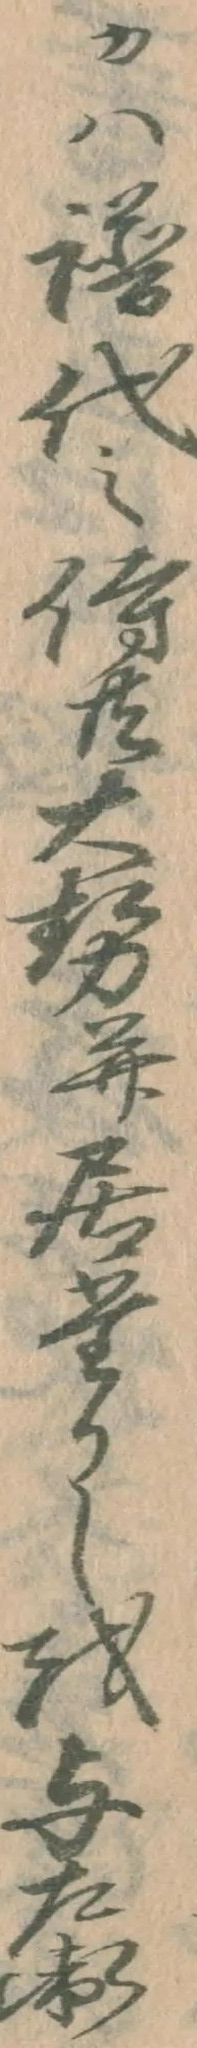かは譜代之侍共大勢幷居堂りし越与左衛
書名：切支丹御退治記 49巻. [4]
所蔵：国立国会図書館 National Diet Library, JAPAN
